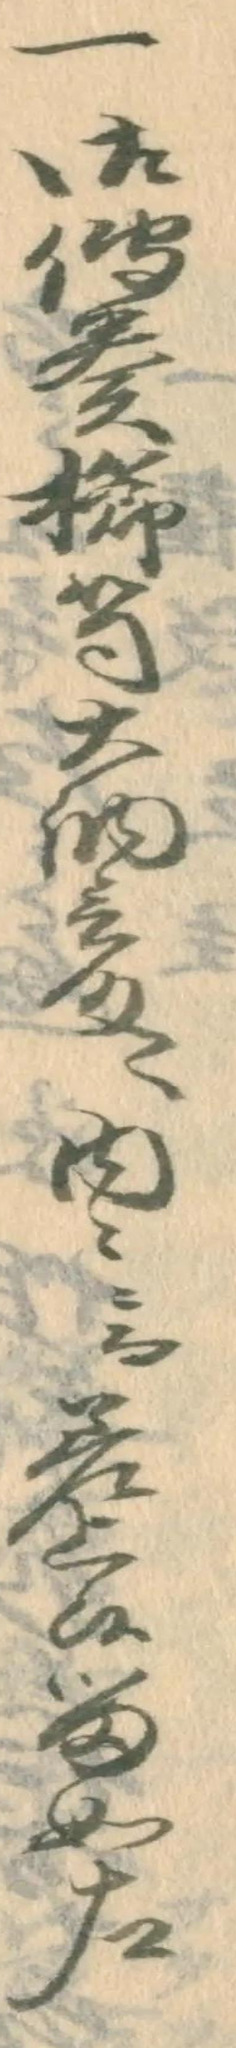一御伝奏櫛笥大納言殿へ内々ニ而差上候留如左

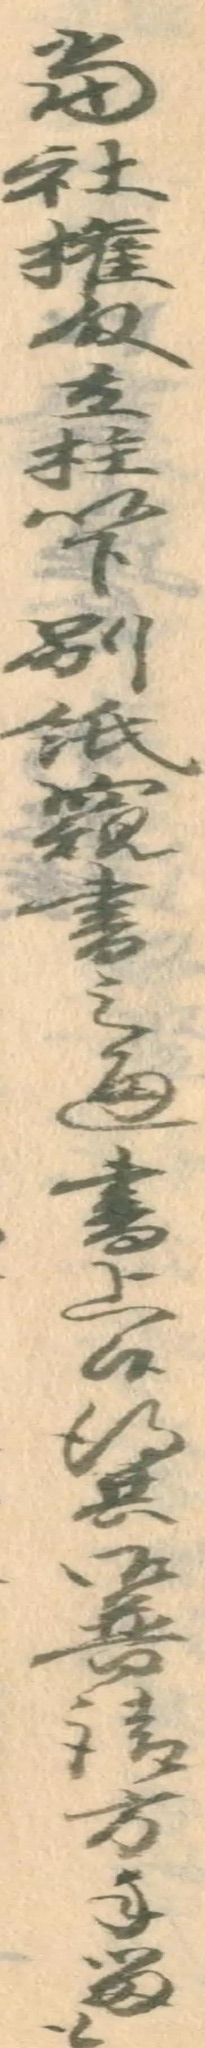当社権殿立柱以下別紙窺書之通書上候得共御普請方手留も
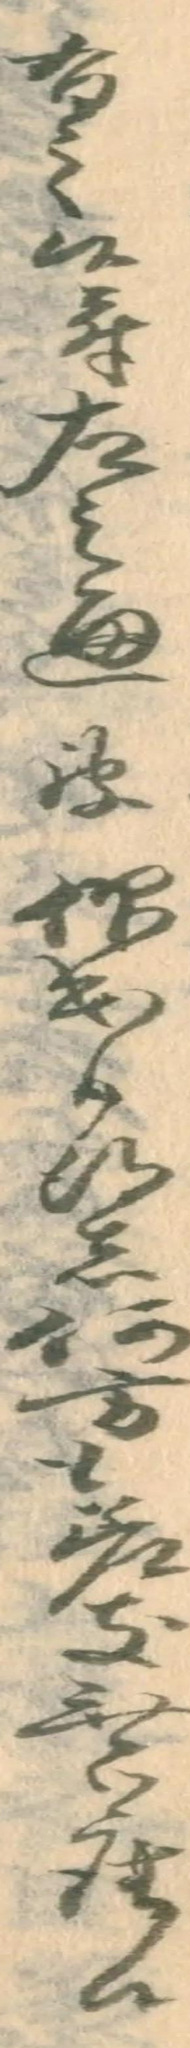有之候ニ付左之通被仰出候得は何方も差支無御座候
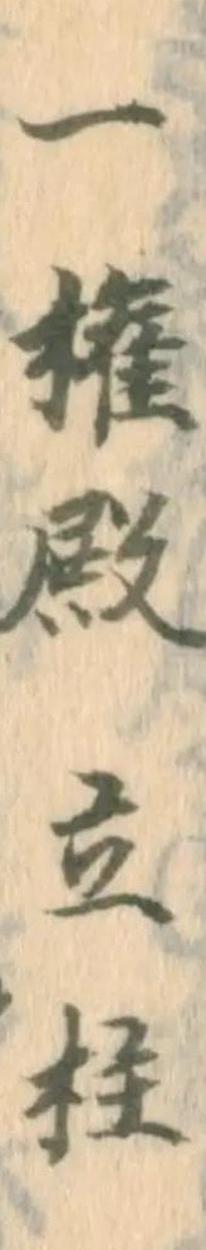一権殿立柱
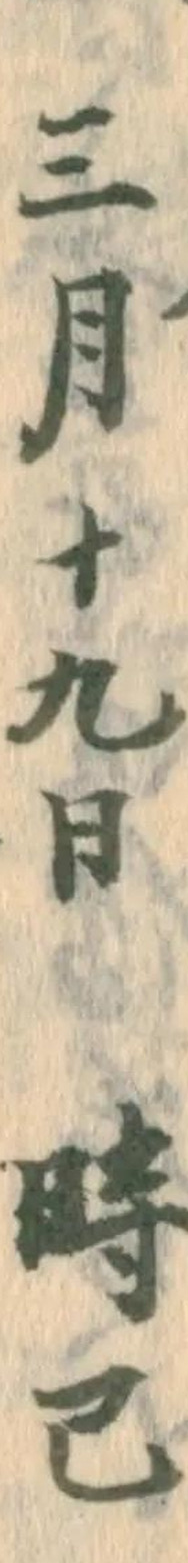三月十九日時己
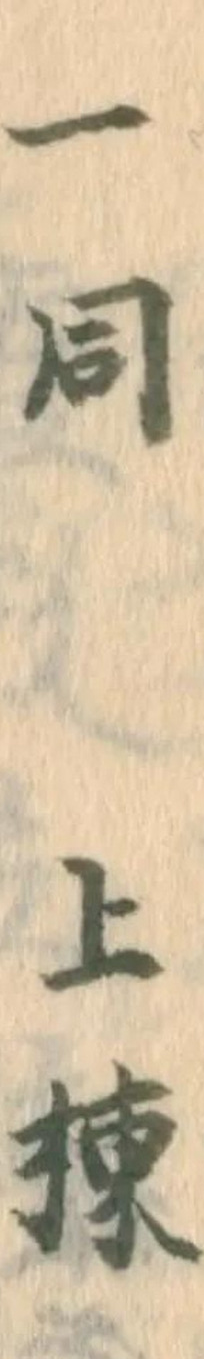一同上棟
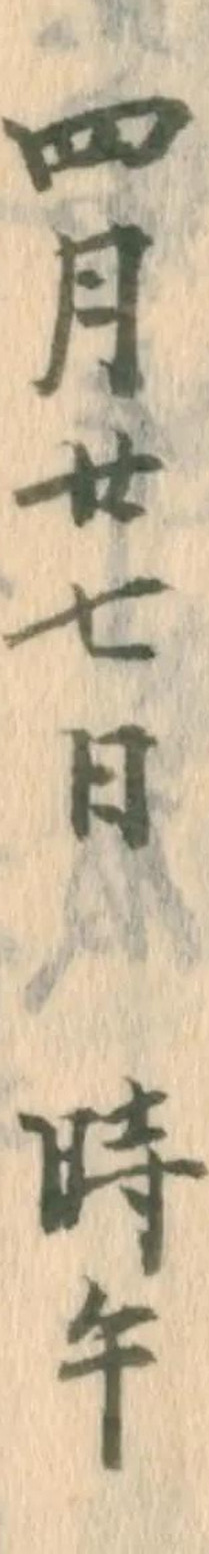四月廿七日時午
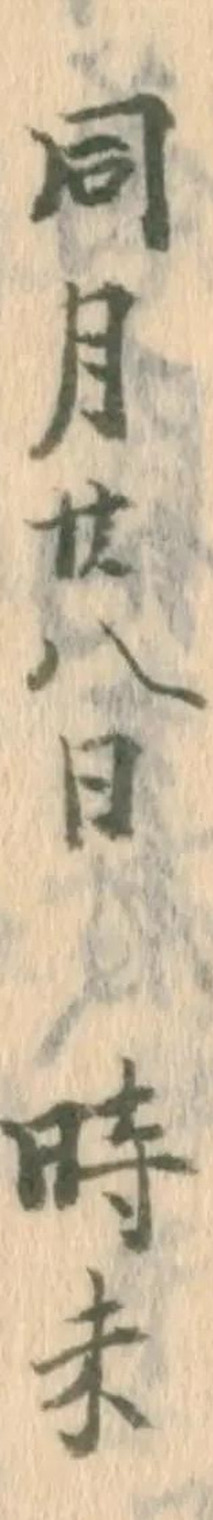同月廿八日時未
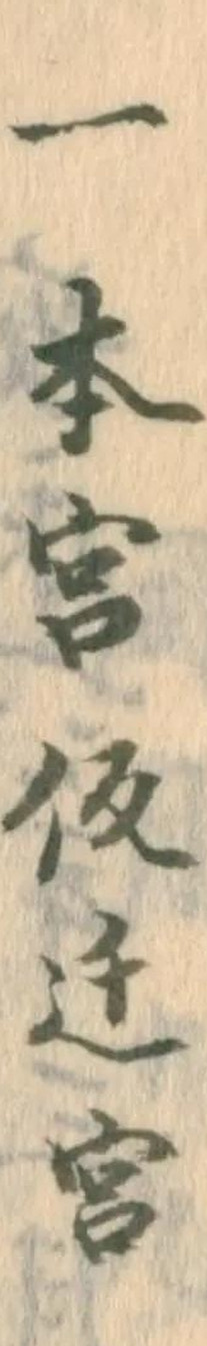一本宮仮迁宮
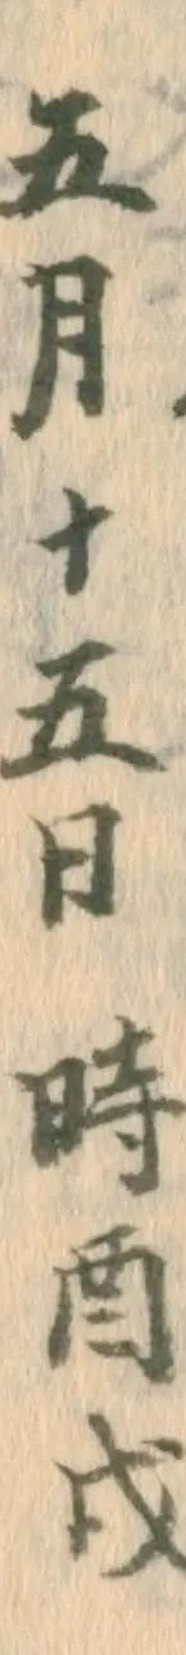五月十五日時酉戌
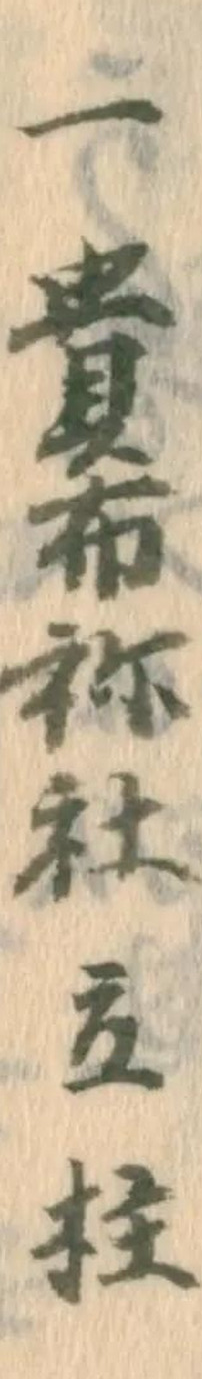一貴布祢杜立柱
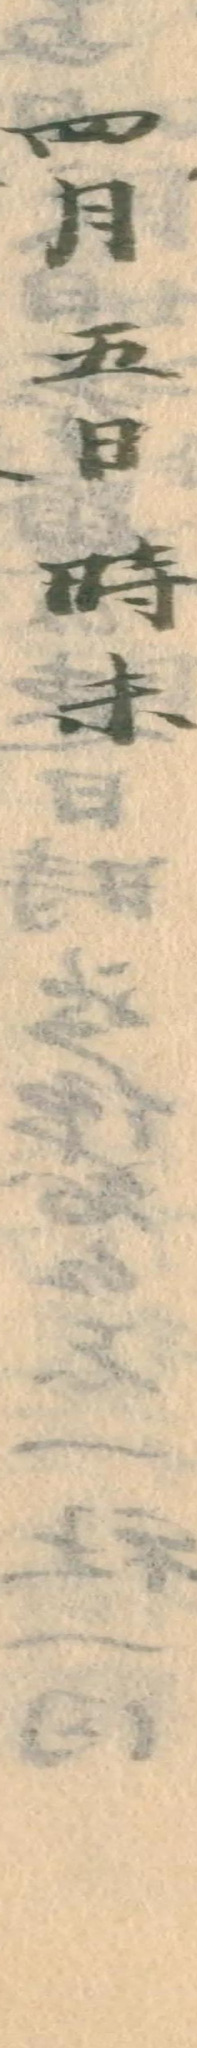四月五日時未
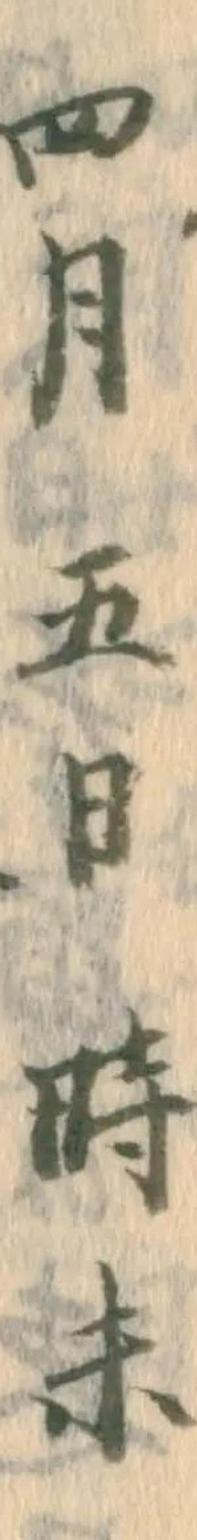四月五日時未
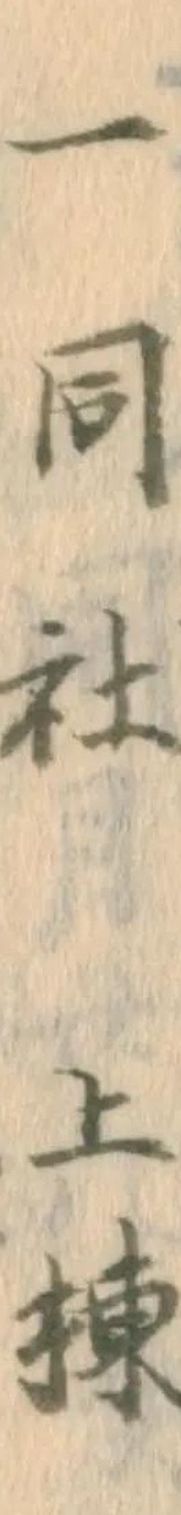一同社上棟
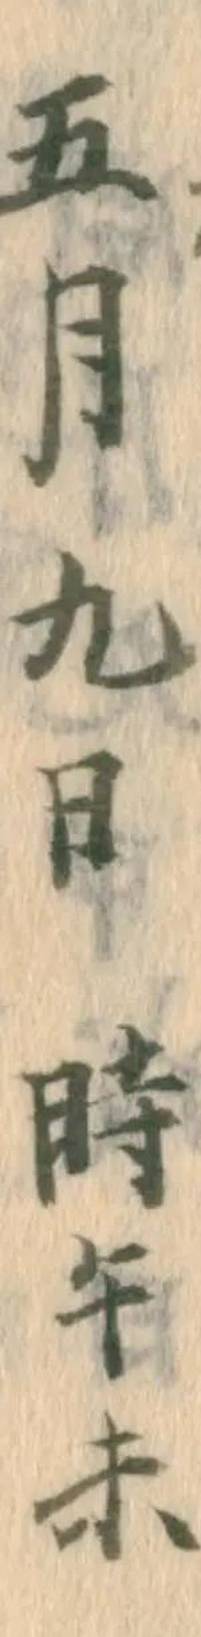五月九日時午未
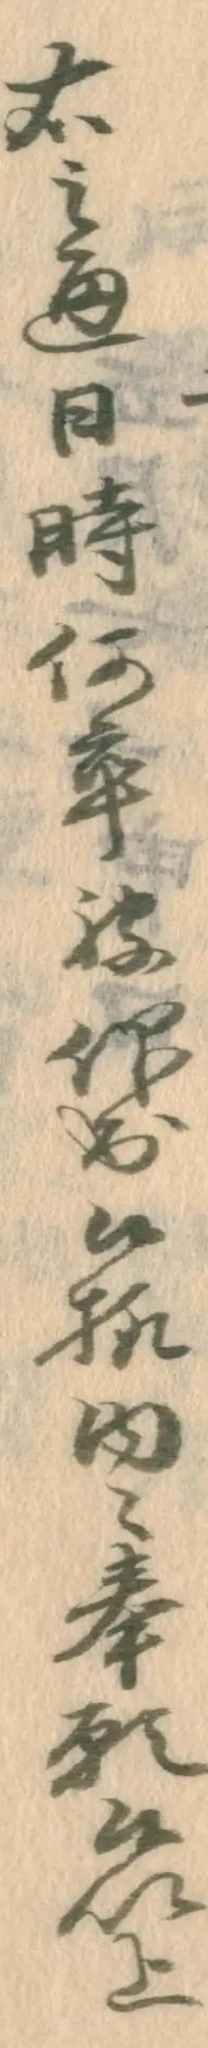右之通日時何卒被仰出候様内々奉願候以上
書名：賀茂社記録. 第17冊
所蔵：国立国会図書館 National Diet Library, JAPAN
